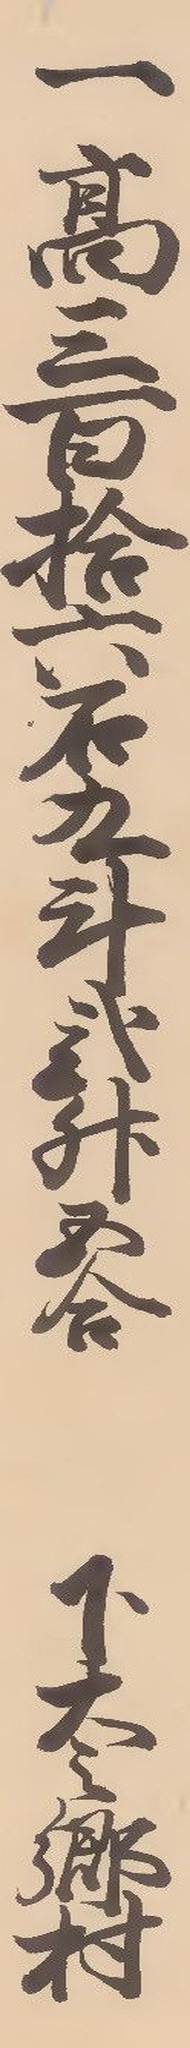一高三百拾六石九斗弐升五合下大之郷村
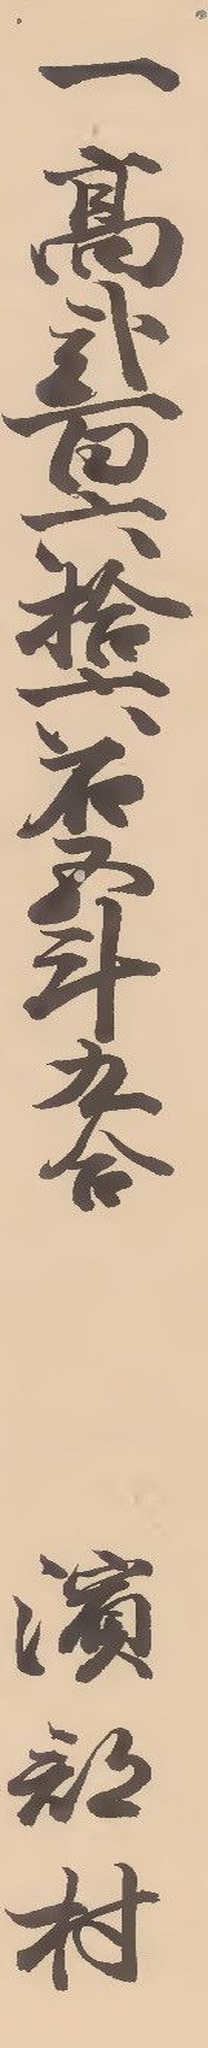一高弐百六拾六石五斗九合浜部村
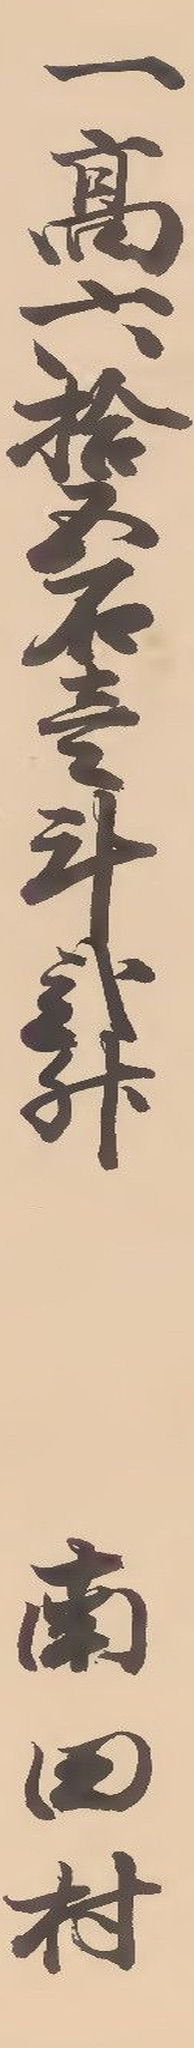一高六拾五石壱斗弐升南田村
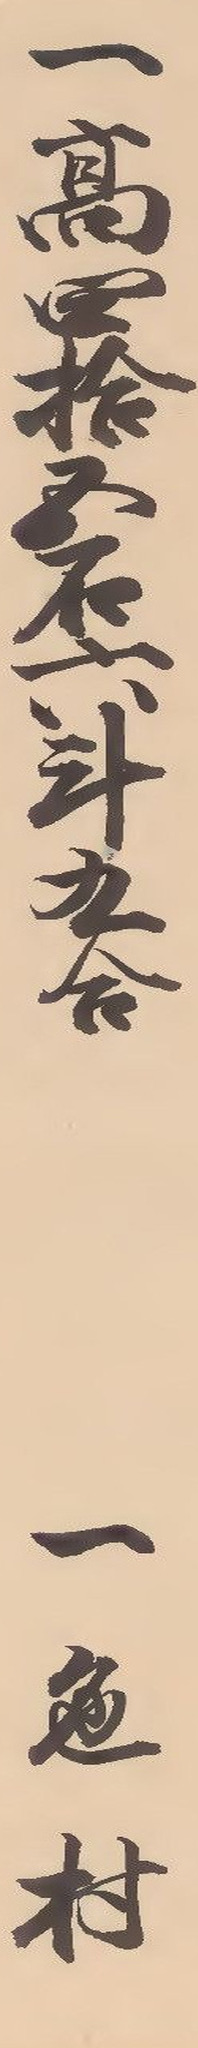一高四拾五石六斗九合一色村
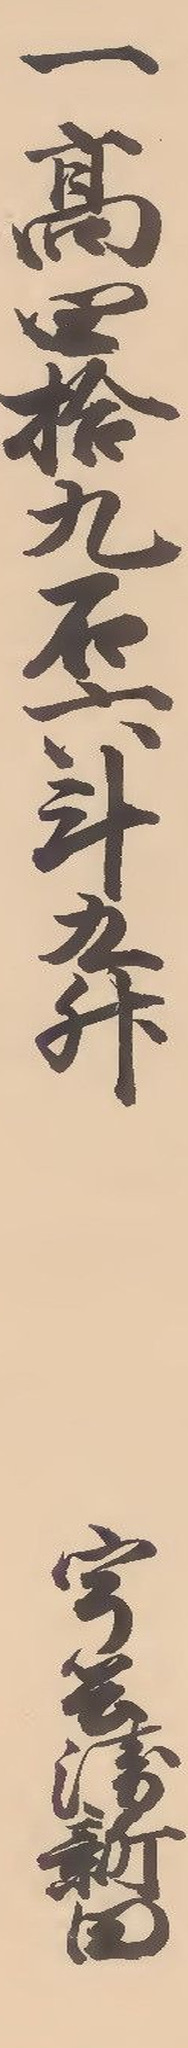一高四拾九石六斗九升宇兵衛新田

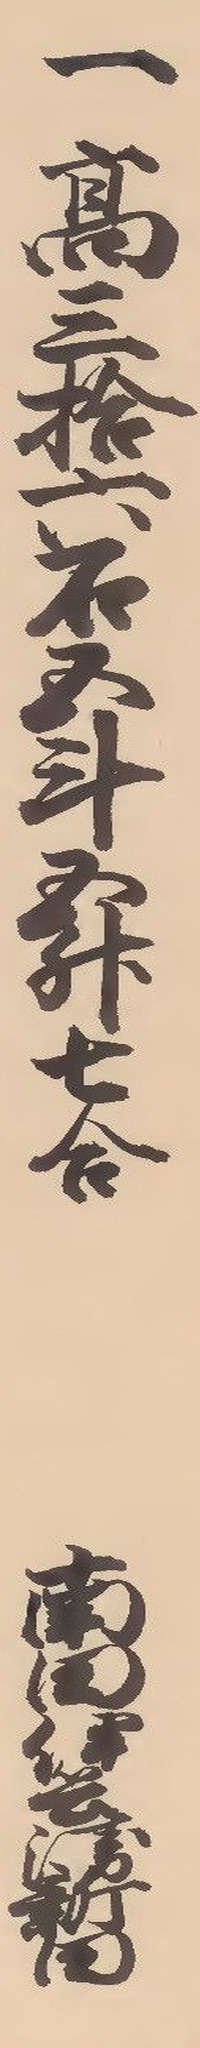一高三拾六石五斗五升七合南田伊兵衛新田
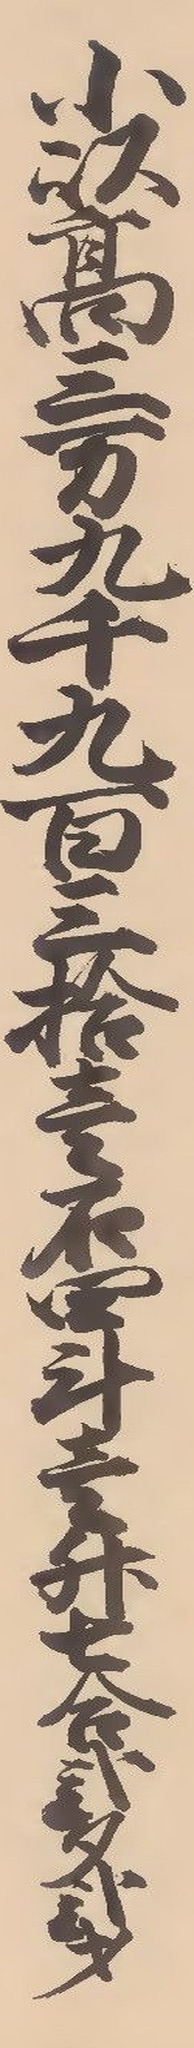小以高三万九千九百三拾壱石四斗壱升七合弐勺弐才
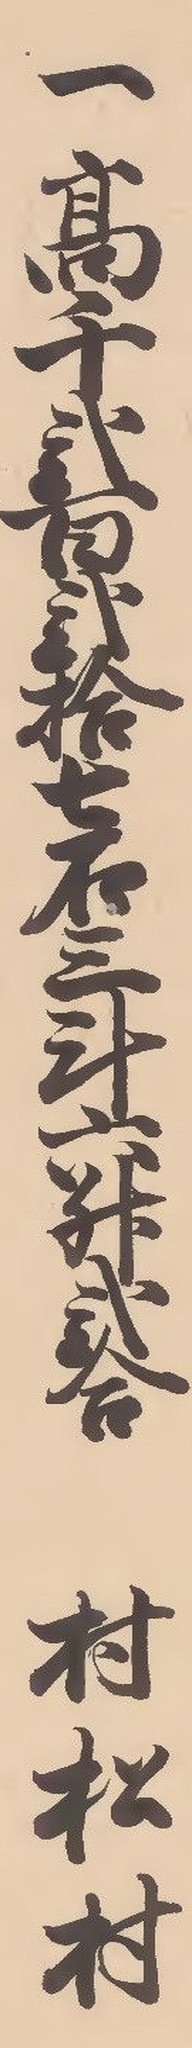一高千弐百弐拾七石三斗六升弐合村松村
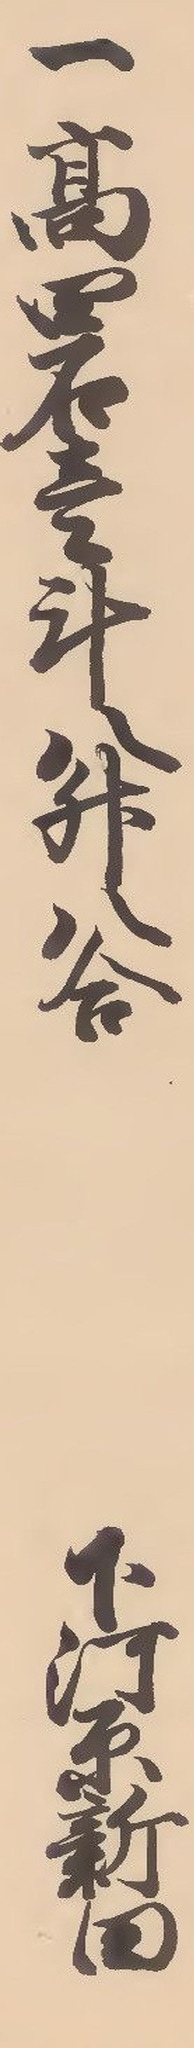一高四石壱斗八升八合下河原新田

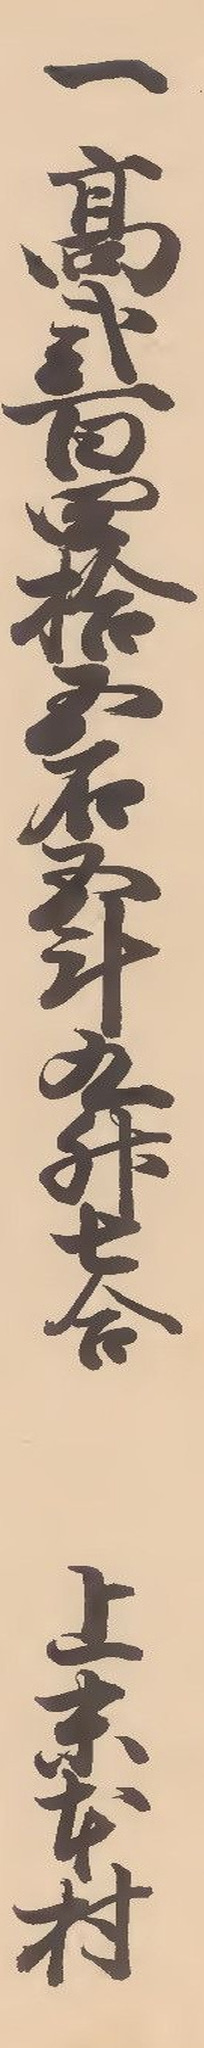一高弐百四拾五石五斗九升七合上末本村
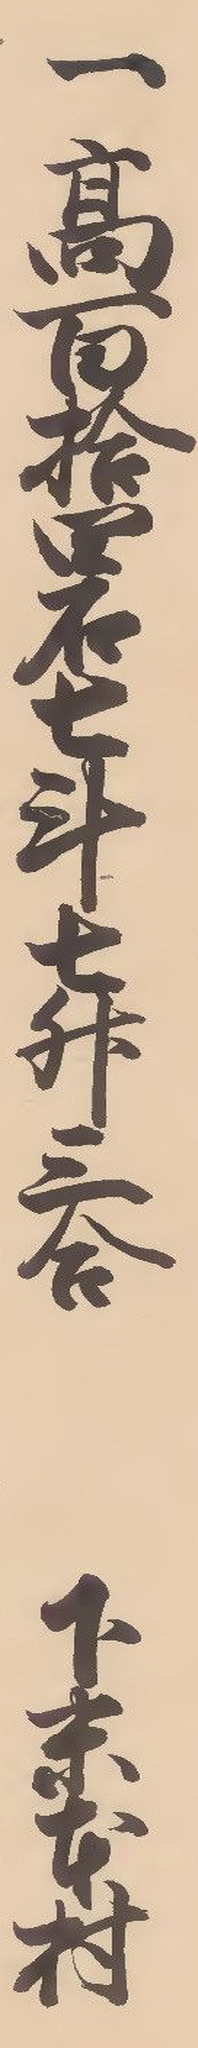一高百拾四石七斗七升三合下末本村
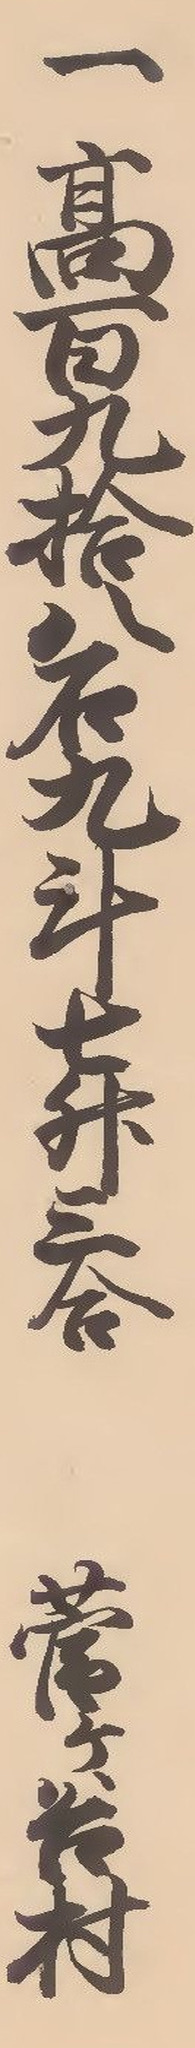一高百九拾八石九斗七升三合菅ヶ谷村
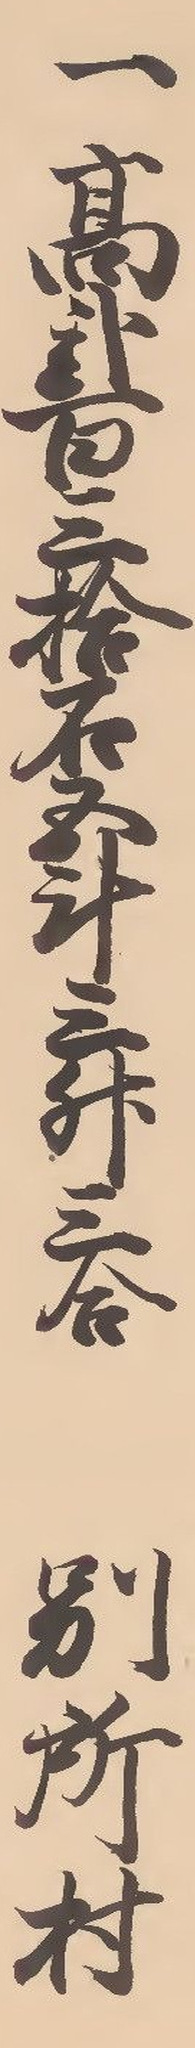一高弐百三拾石五斗三升三合別所村
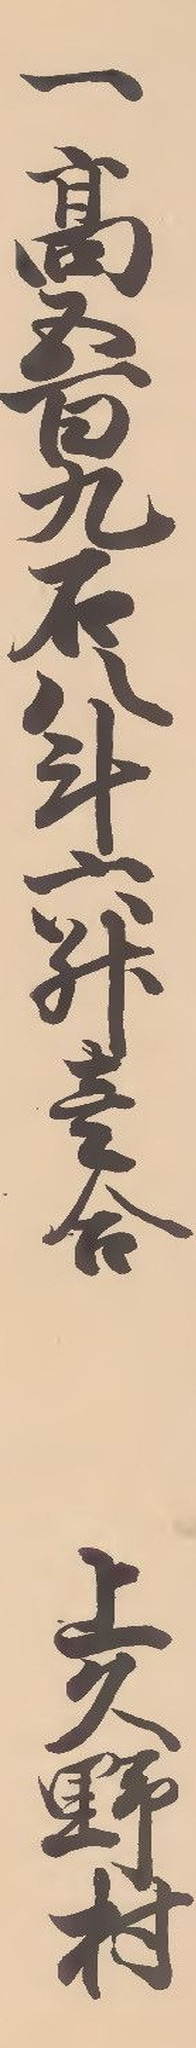一高五百九石八斗六升壱合上久野村
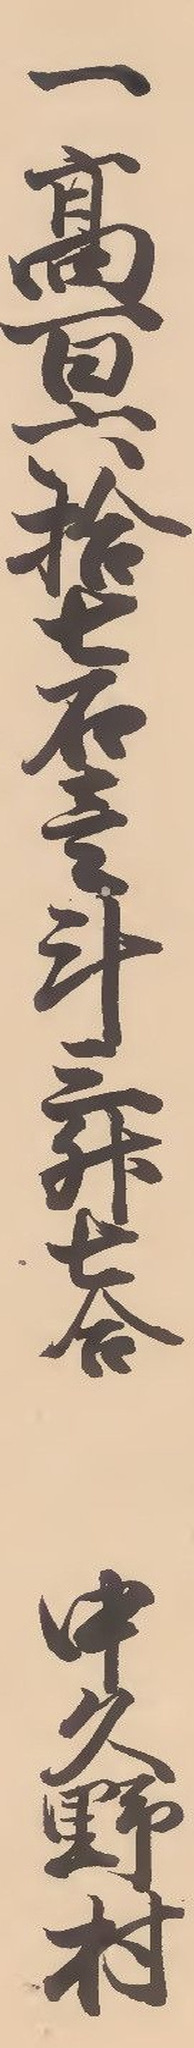一高百六拾七石壱斗三升七合中久野村
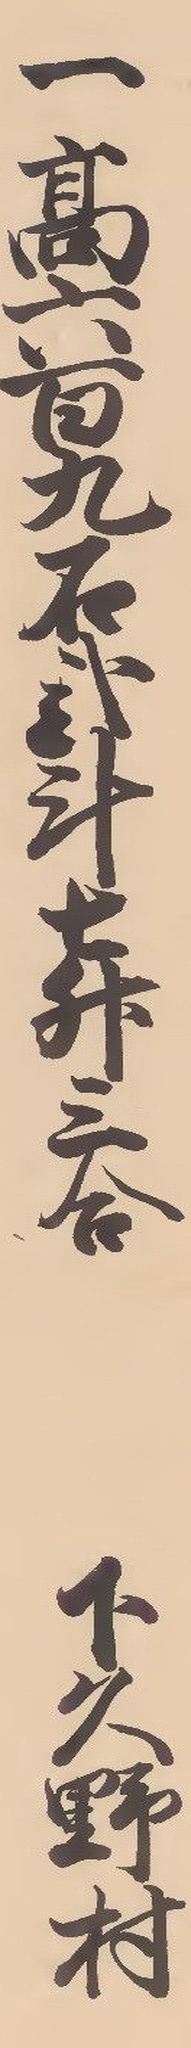一高六百九石弐斗七升三合下久野村
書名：遠江国郷帳
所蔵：国立公文書館 National Archives of Japan
